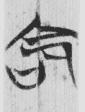命
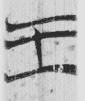王
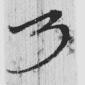乃
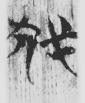{犬弋}
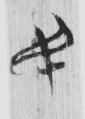民
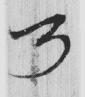乃
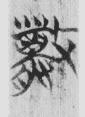○（竊）
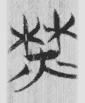焚
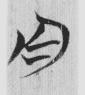舟
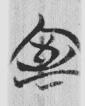室
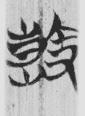鼓
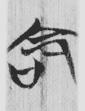命
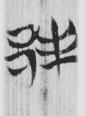邦
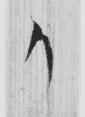人
